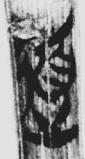道
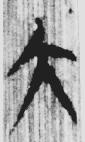大
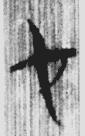才（在）
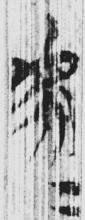{虍介}（嗚呼）
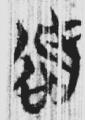欲
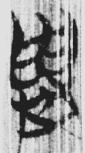○（舉）
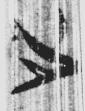之
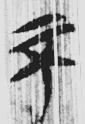不
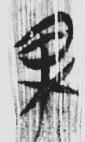果
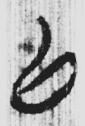㠯
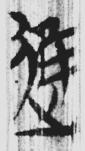進
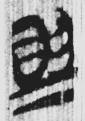則
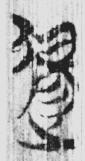逿
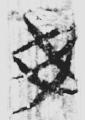𡚦（焉）
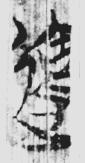達
